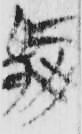駁
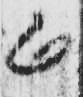㠯（以）
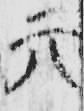亓（其）
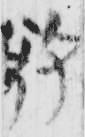敓
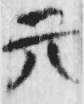亓（其）
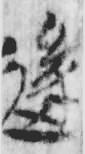○（後）
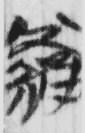羅
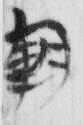軍
